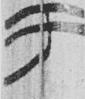于
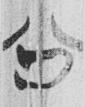公
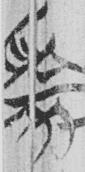○（家）
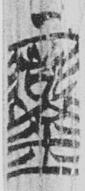鑾（欒）
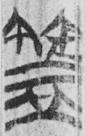箸（書）
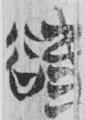欲
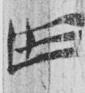乍（作）
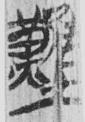○（難）
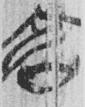害
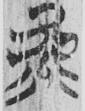參（三）
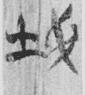○（郤）
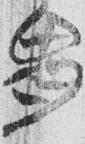胃（謂）
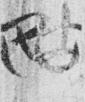姑（苦）
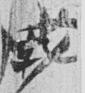○（成）
